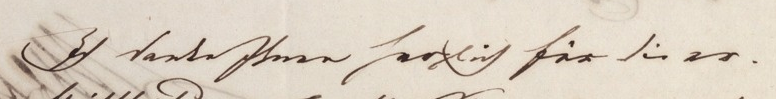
Ich danke Ihnen herzlich für die er-
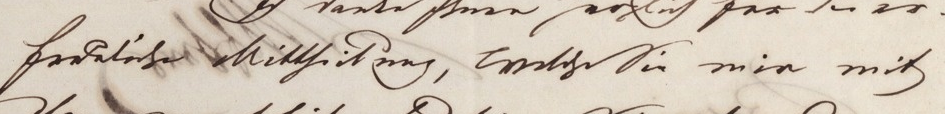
freuliche Mittheilung, welche Sie mir mit
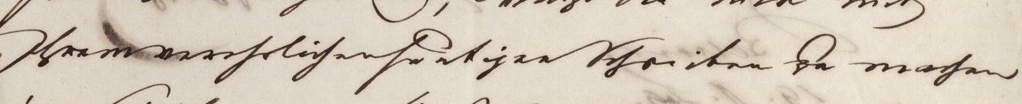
Ihrem verehrlichen heutigen Schreiben zu machen
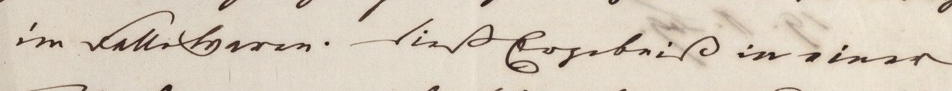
im Falle waren. Dieß Ergebniß in einer
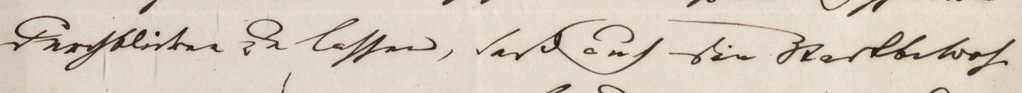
durchblicken zu lassen, daß auch die Stadtbewoh-
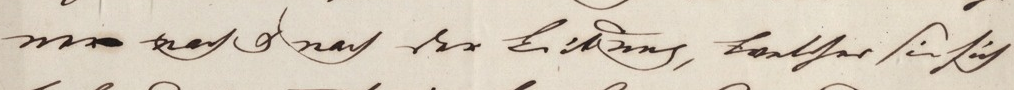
ner nach & nach der Leitung, welcher sie sich
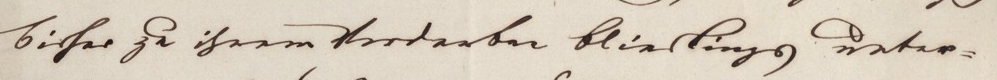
bisher zu ihrem Verderben blindlings unter-
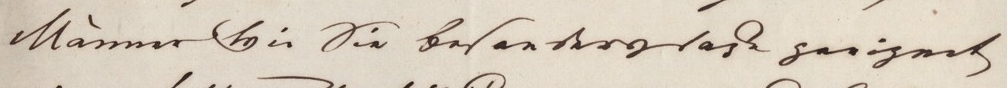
Männer wie Sie besonders dazu geeignet,
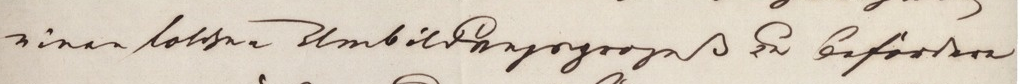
einen solchen Umbildungsprozess zu befördern
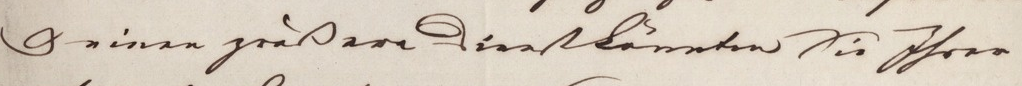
& einen größern Dienst könnten Sie Ihrer
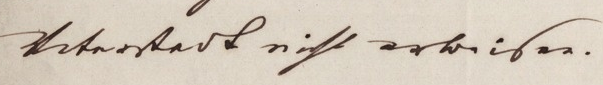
Vaterstadt nicht erweisen.
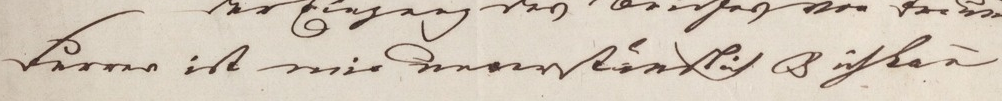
Furrer ist mir unverständlich & ich kann
